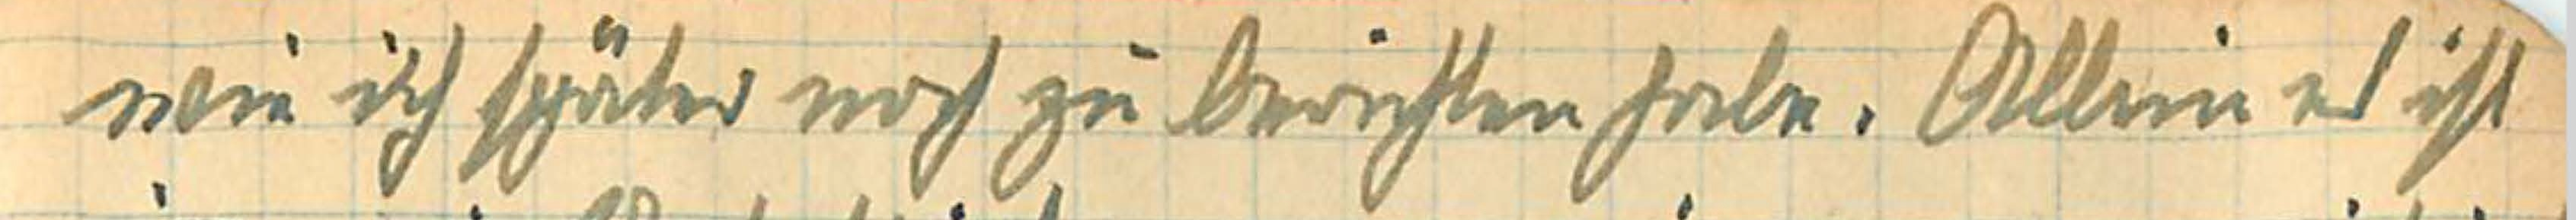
wie ich später noch zu berichten habe. Allein es ist
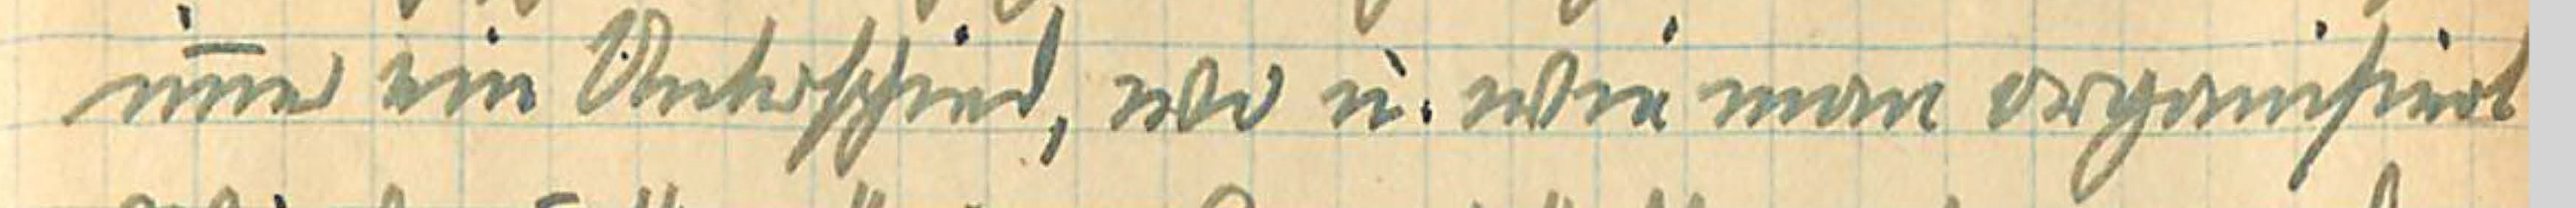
immer ein Unterschied, wo u. wie man organisiert.
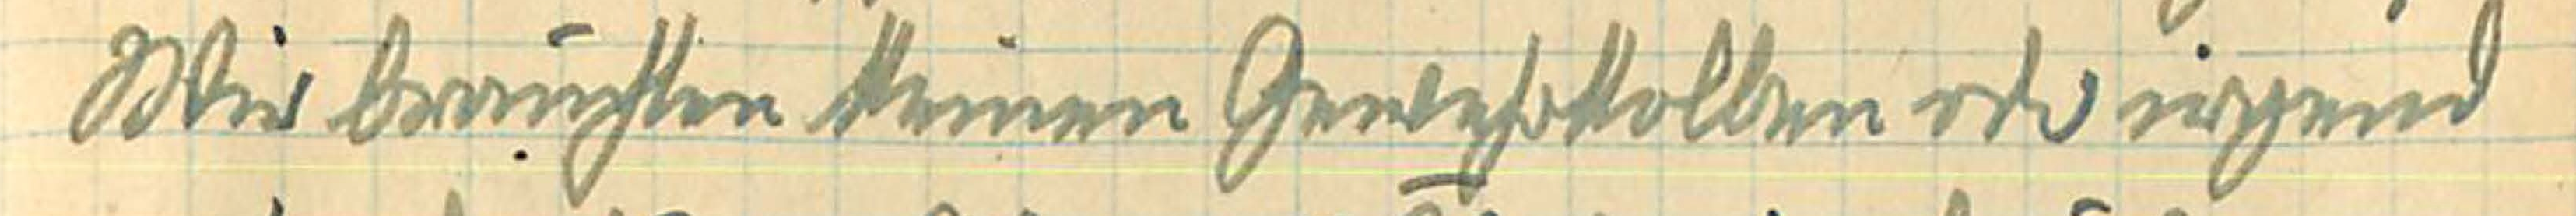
Wir brauchten keinen Gewehrkolben oder irgend
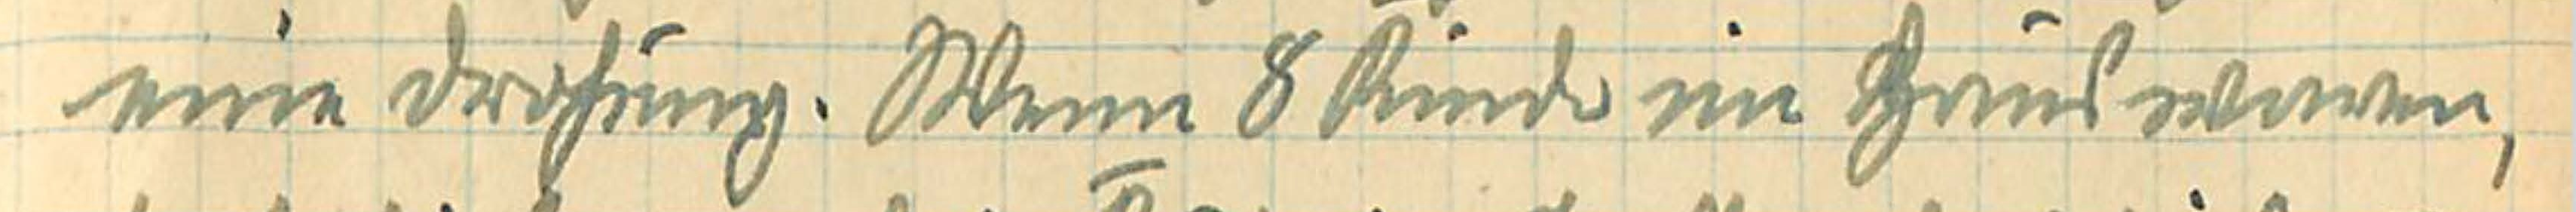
eine Drohung. Wenn 8 Kinder im Haus waren,
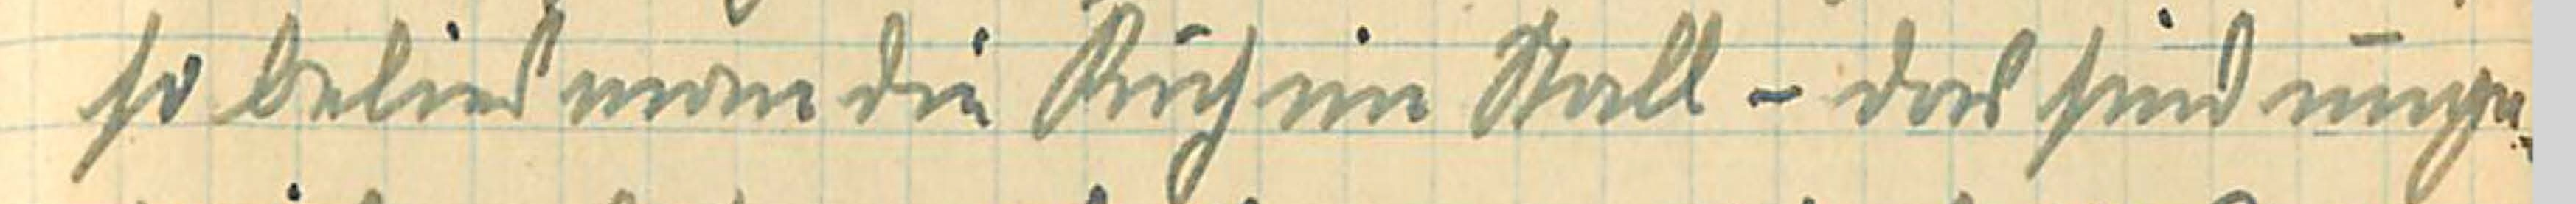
so belies man die Kuh im Stall – das sind unge-
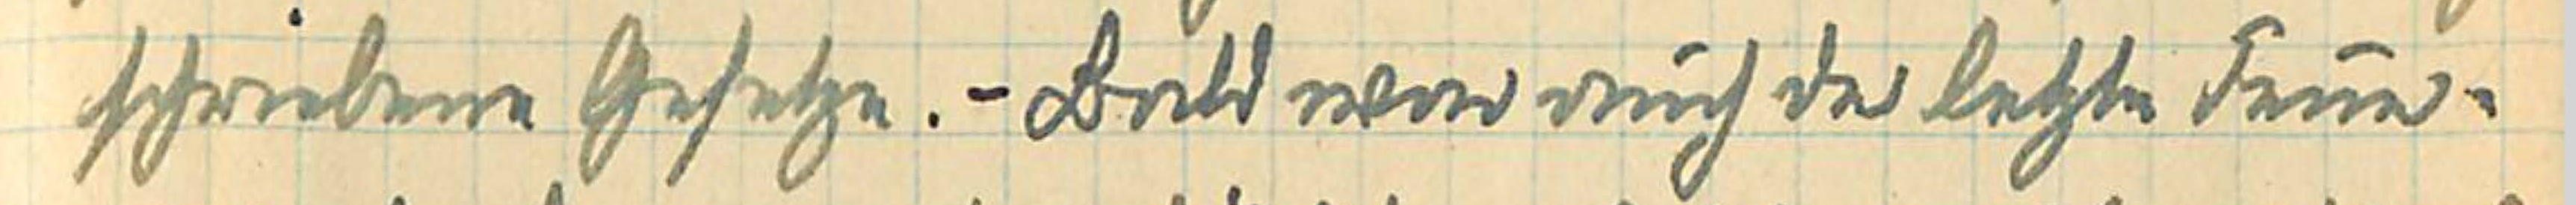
schriebene Gesetze. – Bald war auch der letzte Feuer-
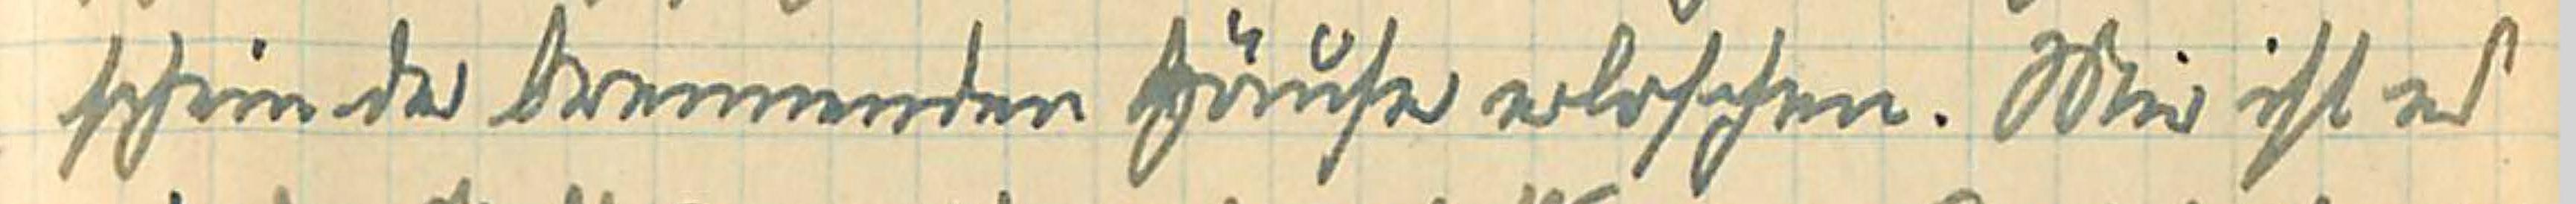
schein der brennenden Häuser erloschen. Mir ist es
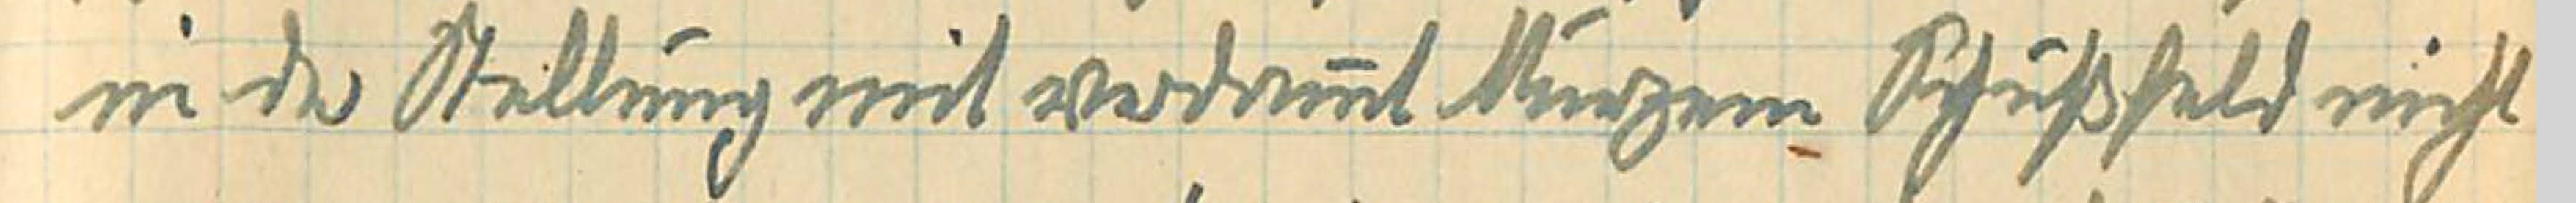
in der Stellung mit verdammt kurzem Schußfeld nicht
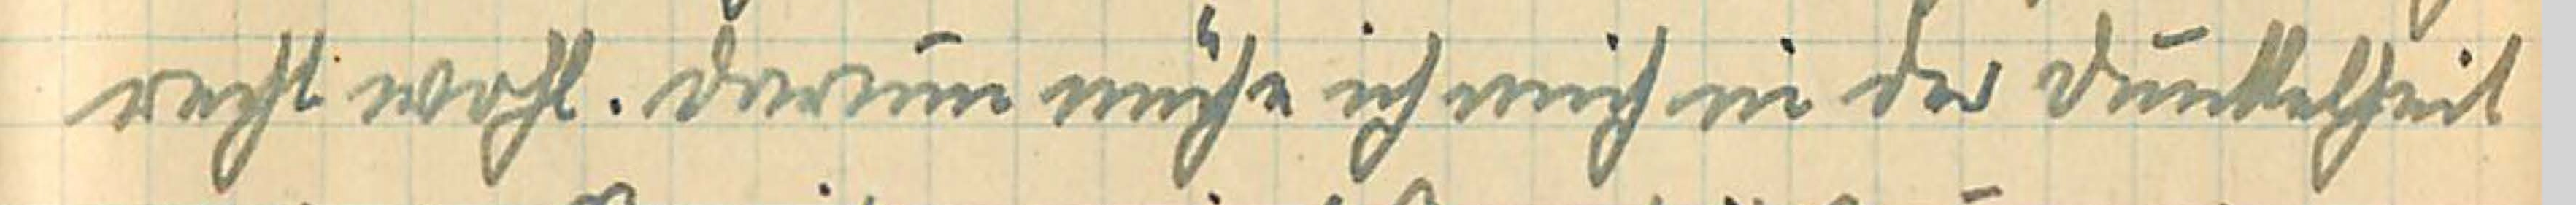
recht wohl. Darum mühe ich mich in der Dunkelheit
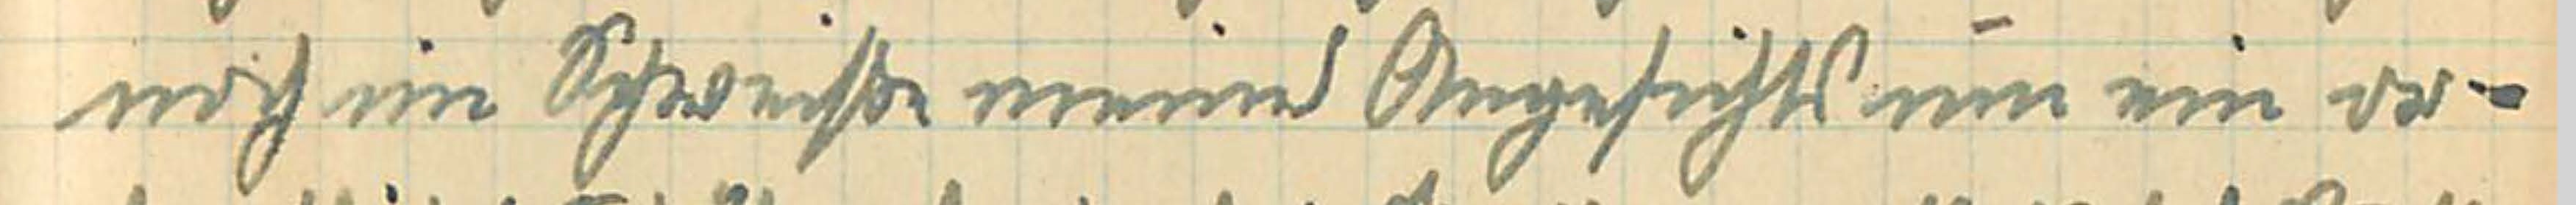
noch im Schweiße meines Angesichts um ein or-
